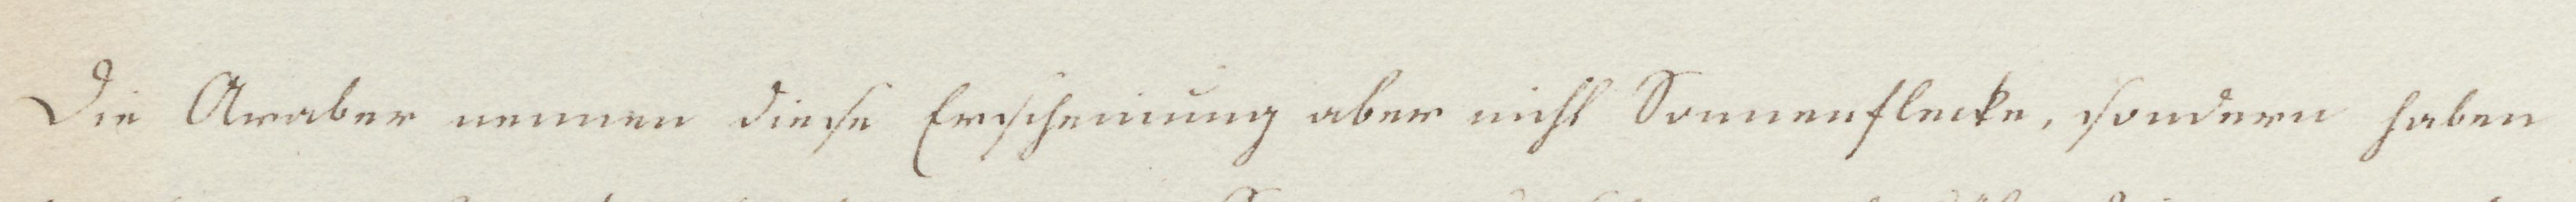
Die Araber nennen diese Erscheinung aber nicht Sonnenflecke, sondern haben
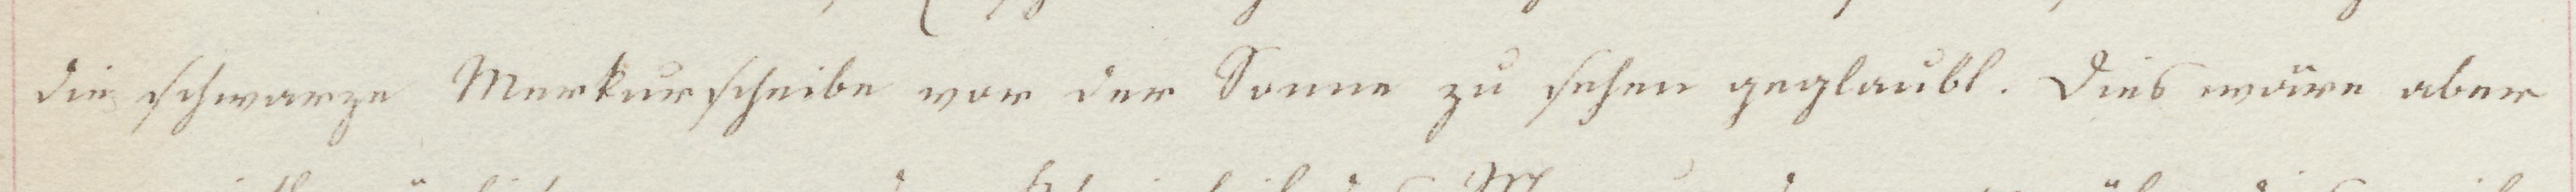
die schwarze Merkurscheibe vor der Sonne zu sehen geglaubt. Dies wäre aber
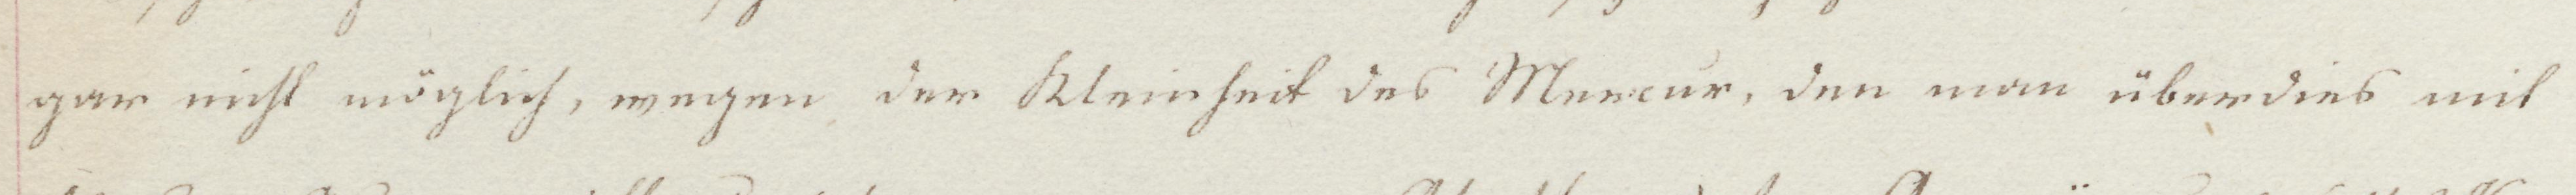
gar nicht möglich, wegen der Kleinheit des Mercur, den man überdies mit
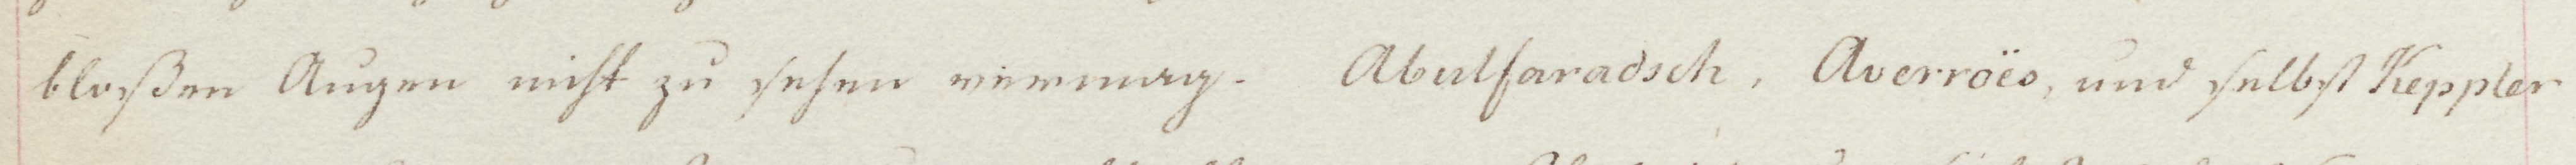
bloßen Augen nicht zu sehen vermag. Abulfaradsch, Averroës, und selbst Keppler
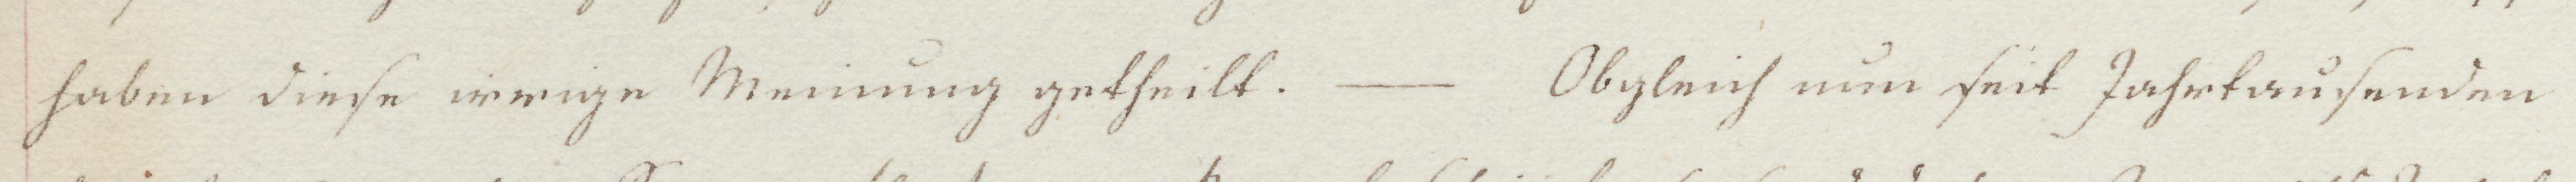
haben diese irrige Meinung getheilt. – Obgleich nun seit Jahrtausenden
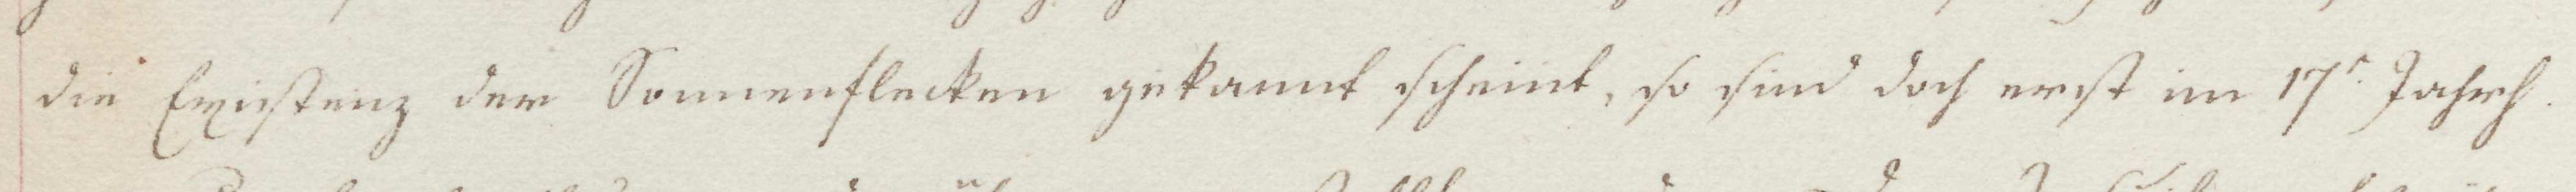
die Existenz der Sonnenflecken gekannt scheint, so sind doch erst im 17t￼ Jahrh.
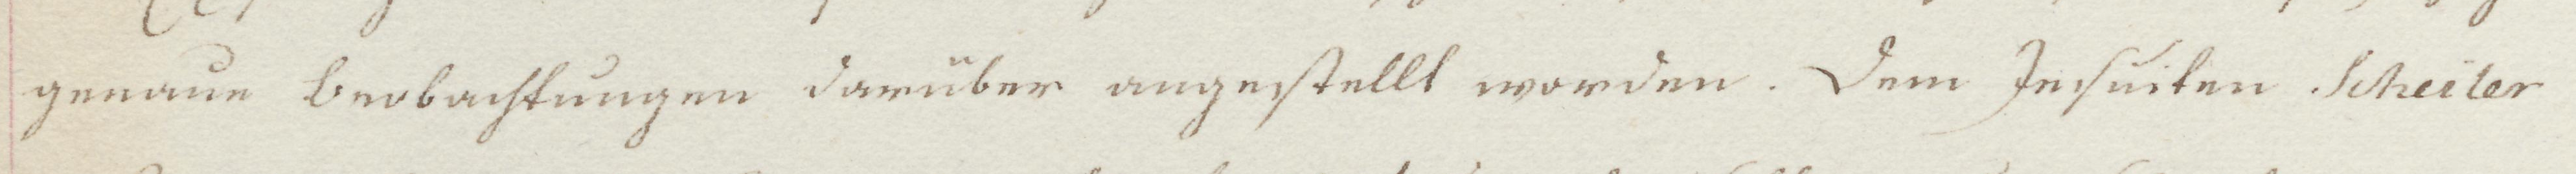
genaue Beobachtungen darüber angestellt worden. Dem Jesuiten Scheiler
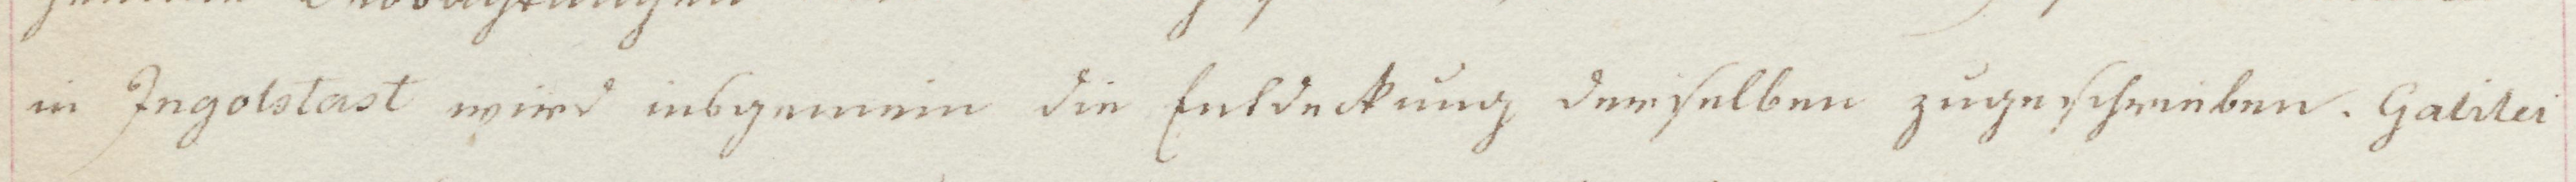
in Ingolstadt wird insgemein die Entdeckung derselben zugeschrieben. Galilei
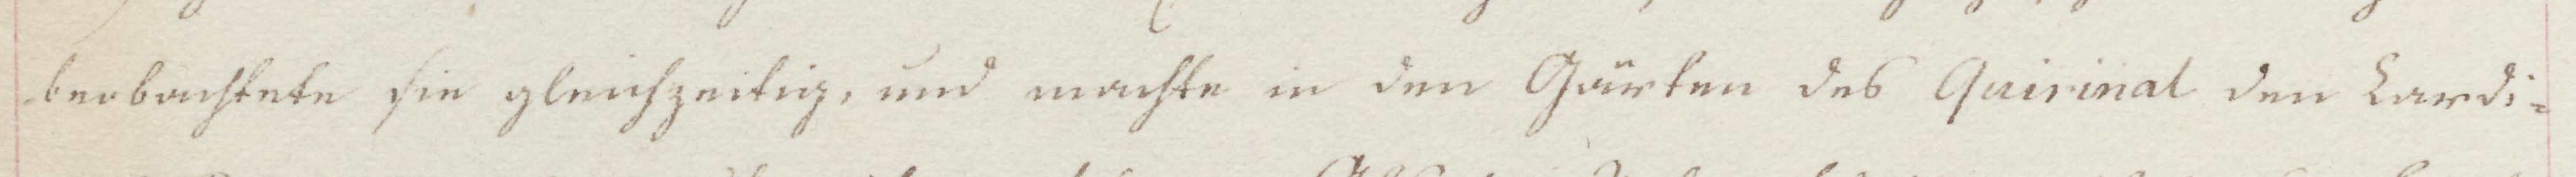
beobachtete sie gleichzeitig, und machte in den Gärten des Quirinal den Cardi-
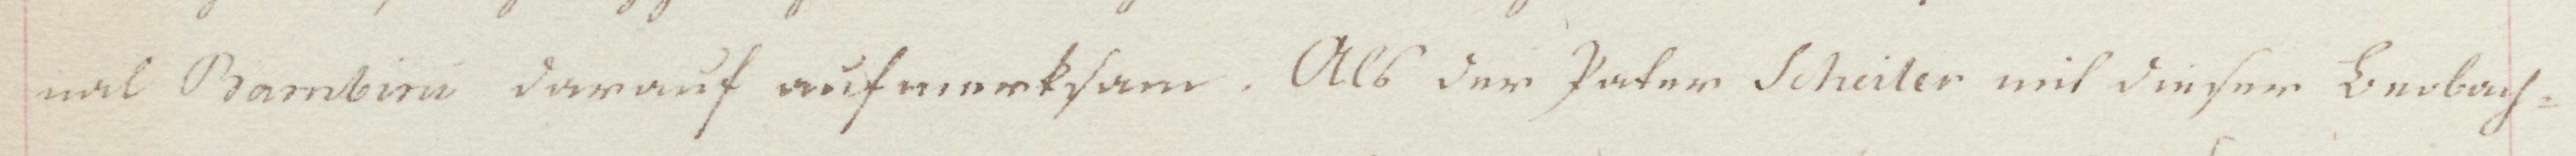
nal Bambini darauf aufmerksam. Als der Pater Scheiler mit dieser Beobach-
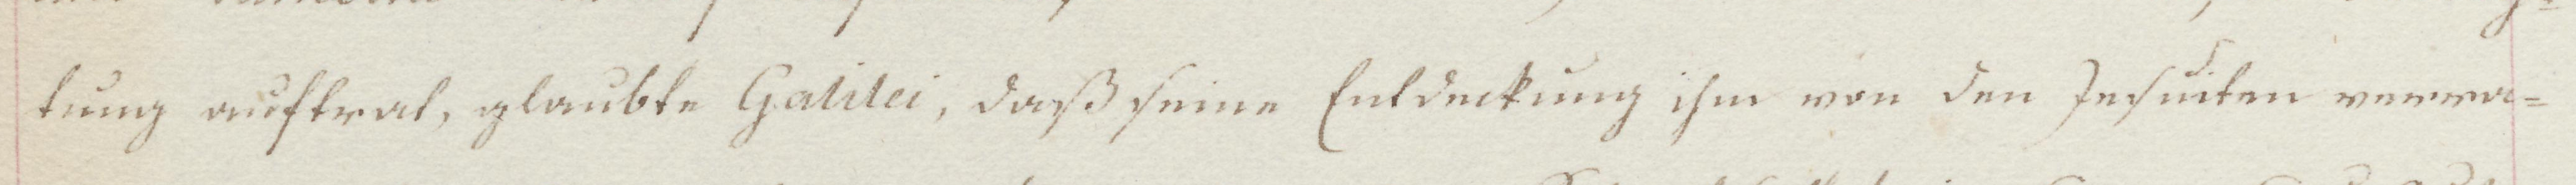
tung auftrat, glaubte Galilei, daß seine Entdeckung ihm von den Jesuiten verra-
